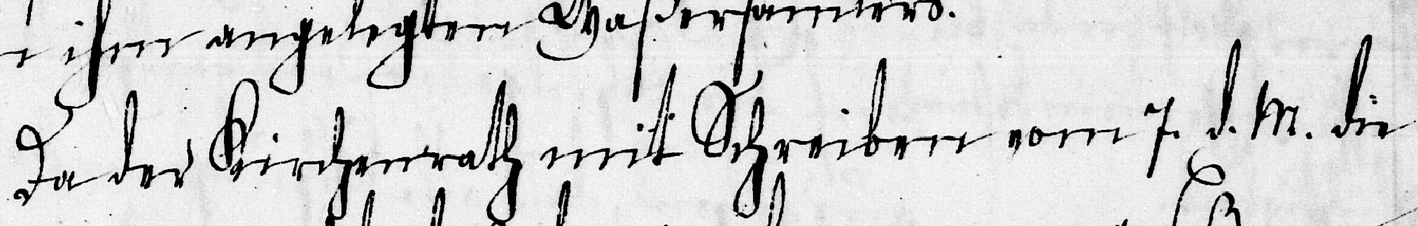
Da der Kirchenrath mit Schreiben vom 7. d. M. die
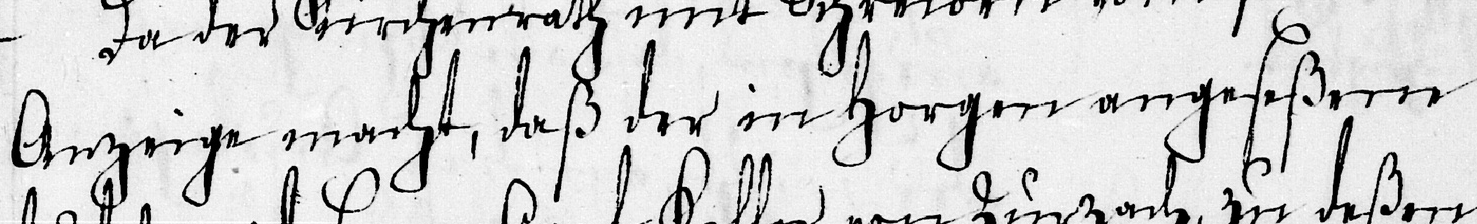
Anzeige macht, daß der in Horgen angeseßene
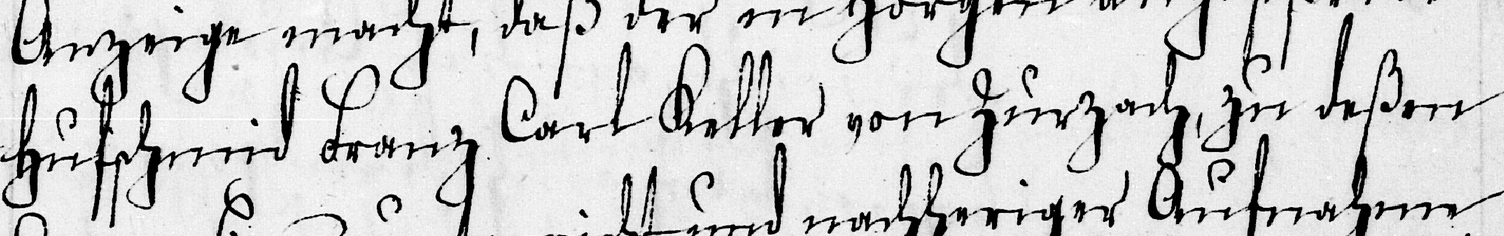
Hufschmid Franz Carl Keller von Zurzach, zu deßen
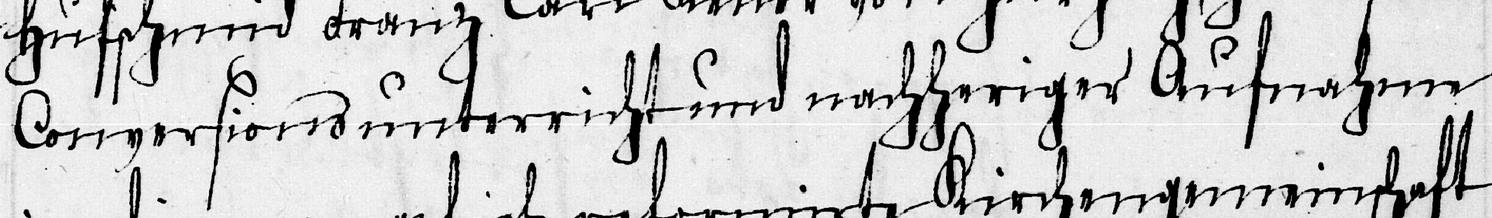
Conversionsunterricht und nachheriger Aufnahme
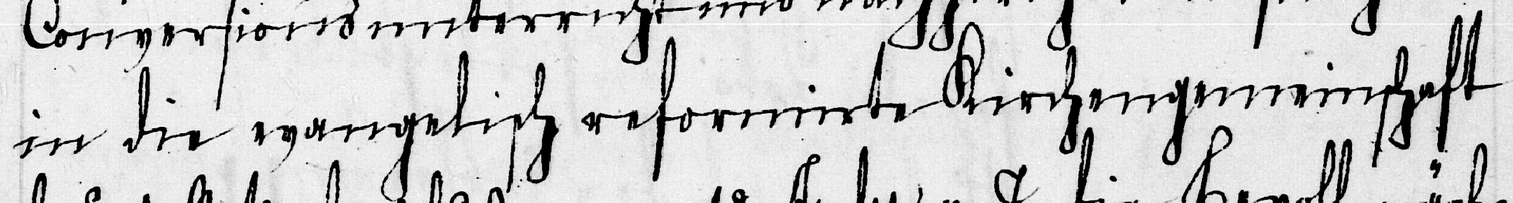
in die evangelisch reformierte Kirchengemeinschaft
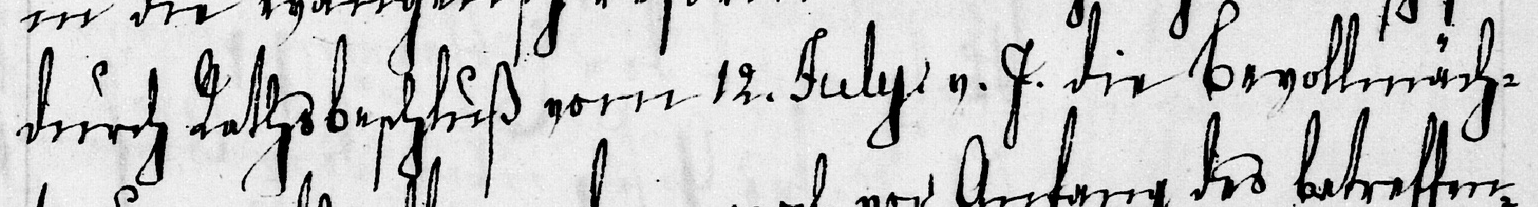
durch Rathsbeschluß vom 12. July v. J. die Bevollmäch¬
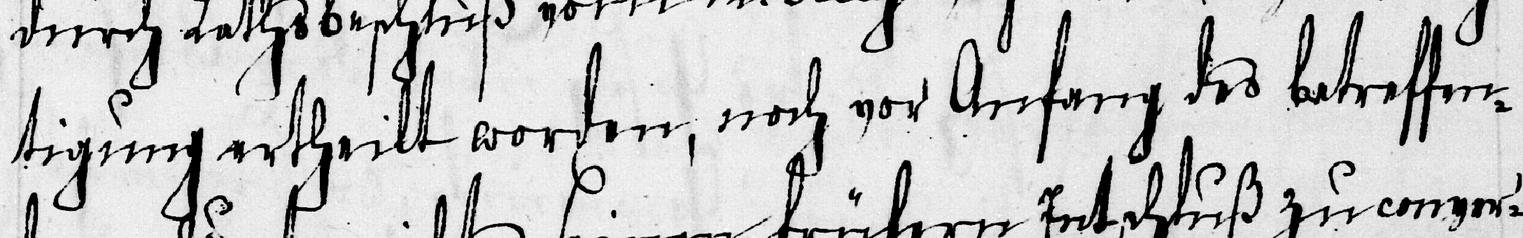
tigung ertheilt worden, noch vor Anfang des betreffen¬
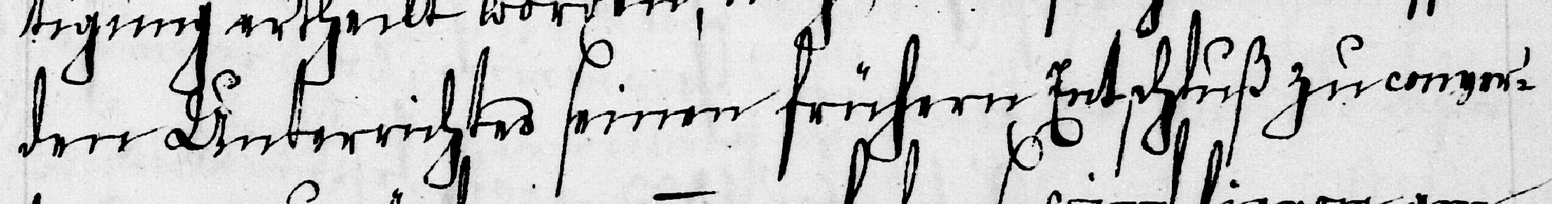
den Unterrichtes seinen frühern Entschluß zu conver¬
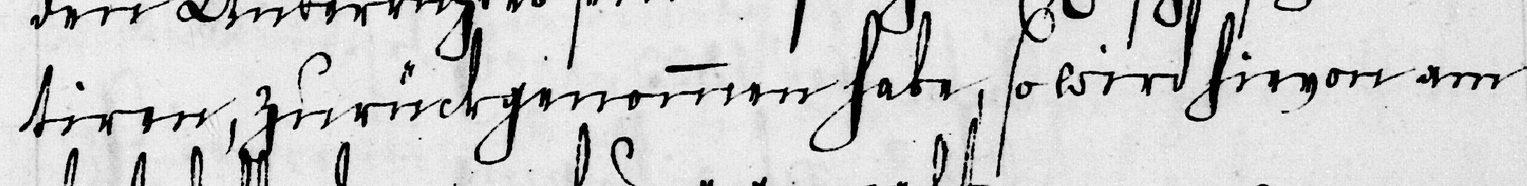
tiren, zurückgenommen habe, so wird hievon am
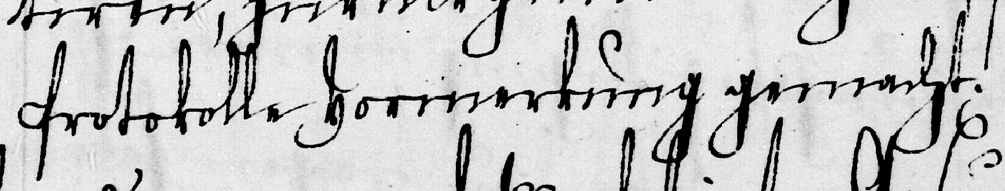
Protokolle Vormerkung gemacht.
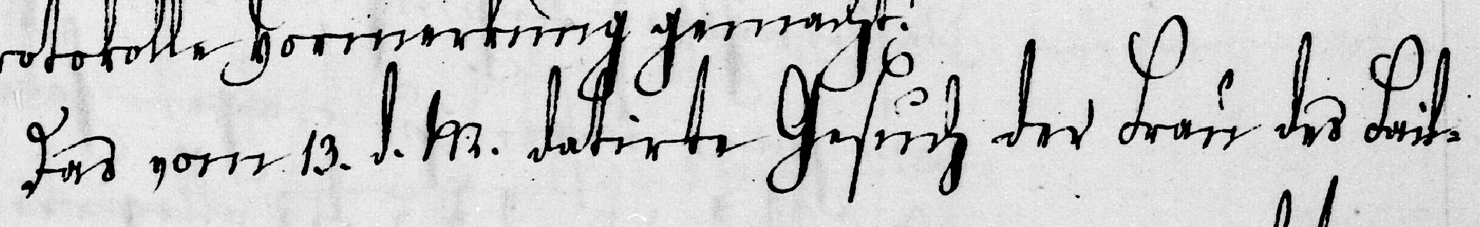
Das vom 13. d. M. datirte Gesuch der Frau des Fail-
